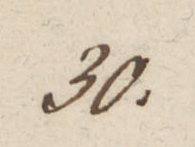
30.
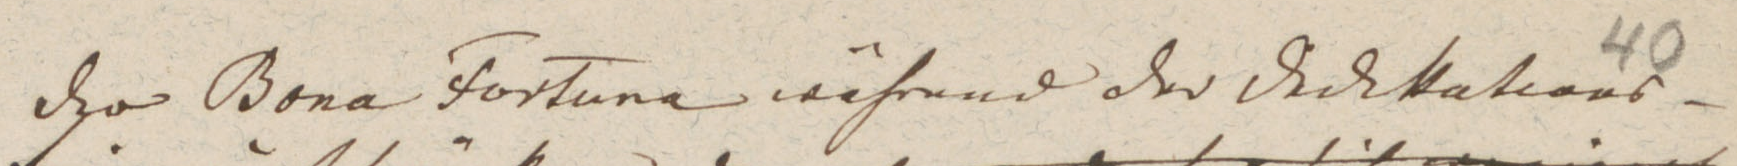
der Bona Fortuna während der Dedikations-
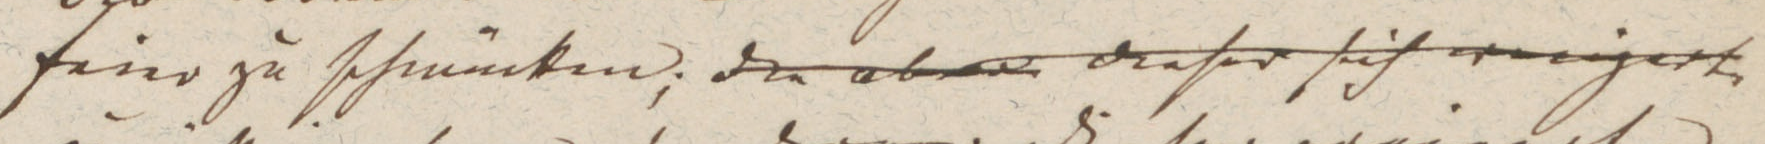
feier zu schmücken; die aber dieser sich weigerte
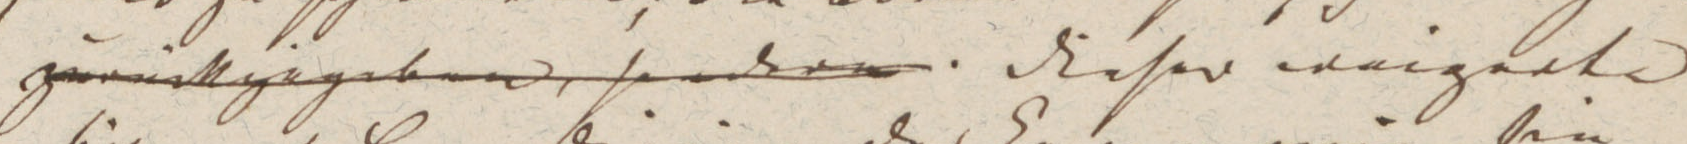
zurückzugeben, sondern. Dieser weigerte
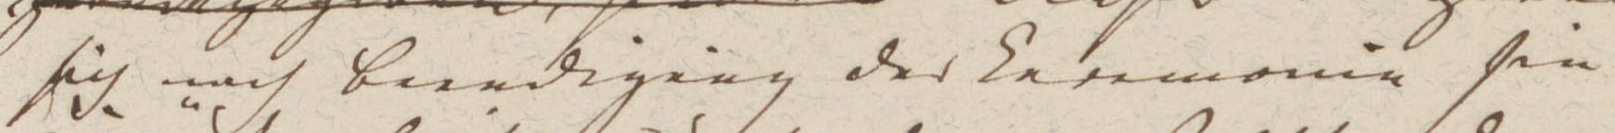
sich nach Beendigung der Ceremonie sie
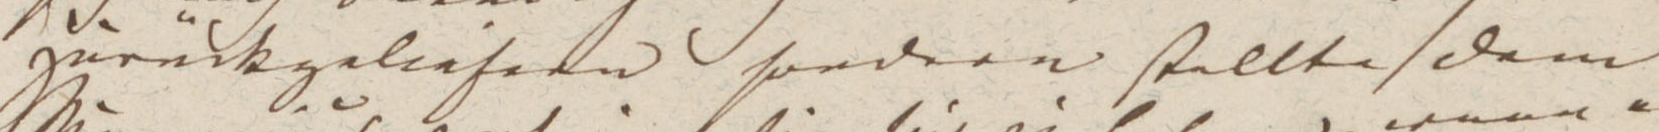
zurückzuliefern sondern stellte dem
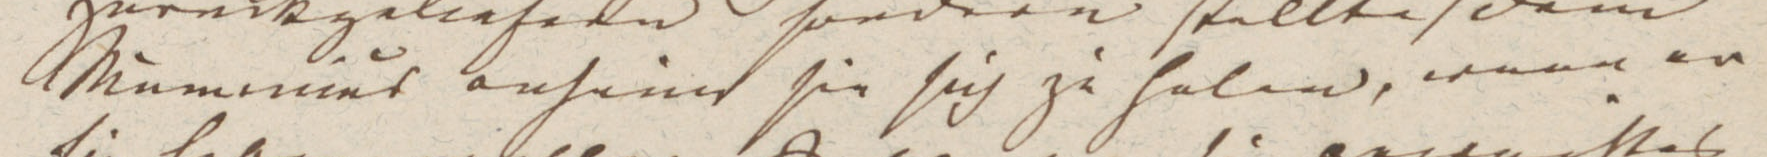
Mummius anheim sie sich zu holen, wenn er
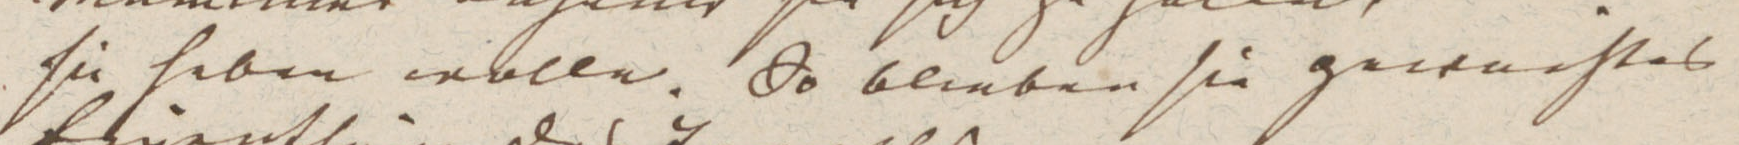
sie haben wolle. So blieben sie geweihtes
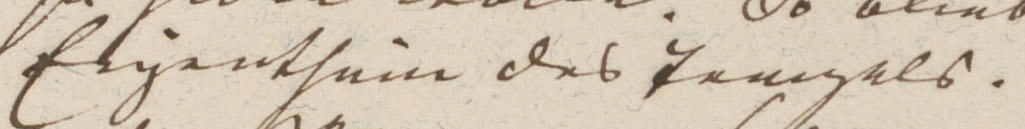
Eigenthum des Tempels.
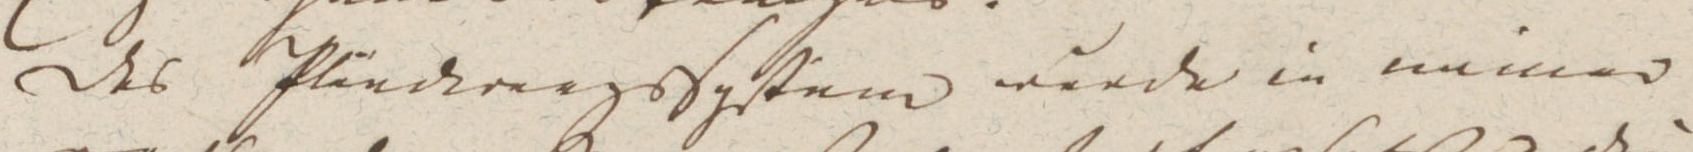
Das Plünderungssystem wurde in immer
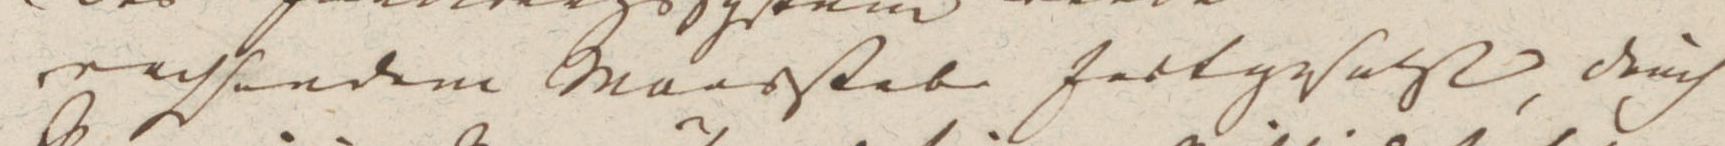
wachsendem Maasstab fortgesetzt, durch
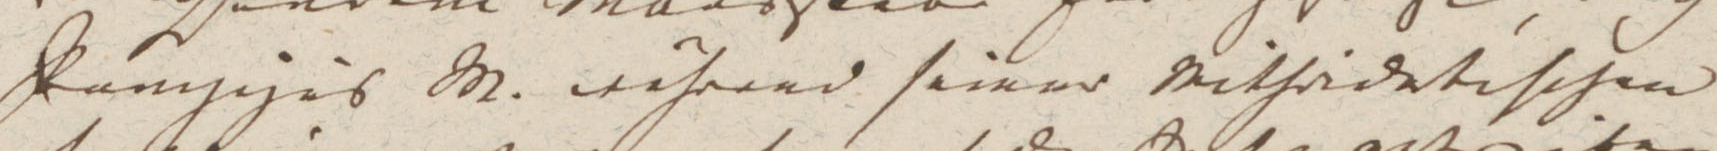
Pompejus M. während seiner mithridatischen
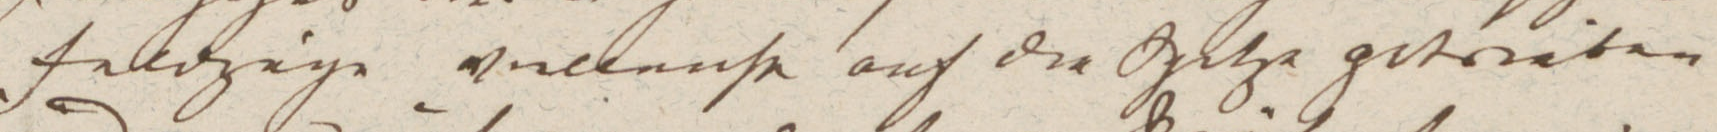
Feldzüge vielleicht auf die Spitze getrieben
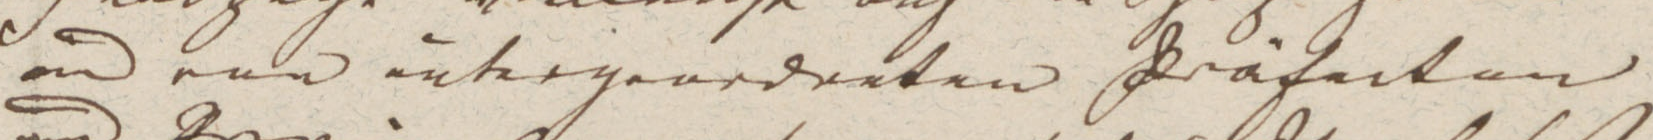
und von untergeordneten Präfecten
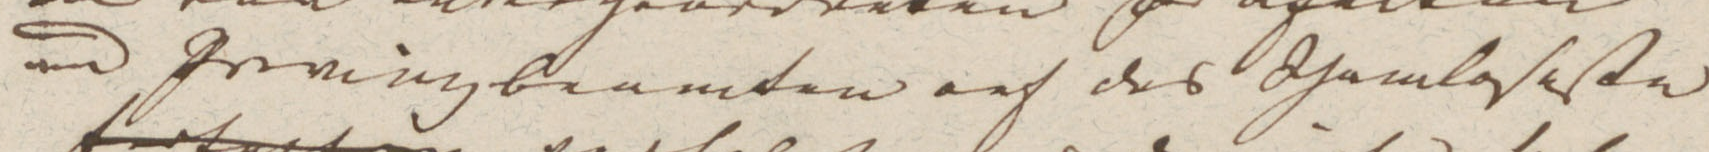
und Provinzbeamten auf das Schamloseste
